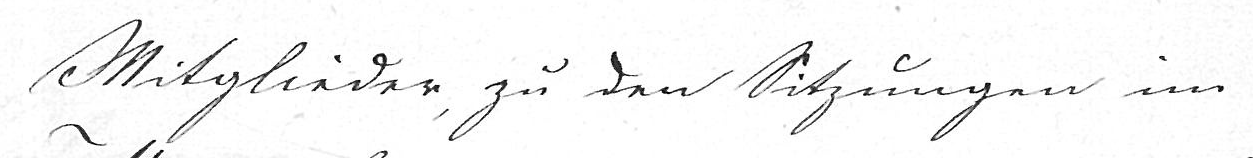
Mitglieder, zu den Sitzungen im
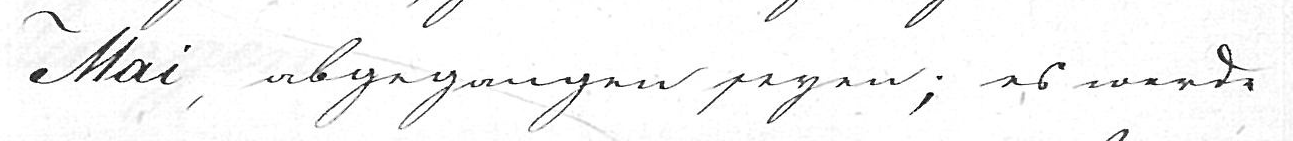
Mai abgegangen seyen; es werde
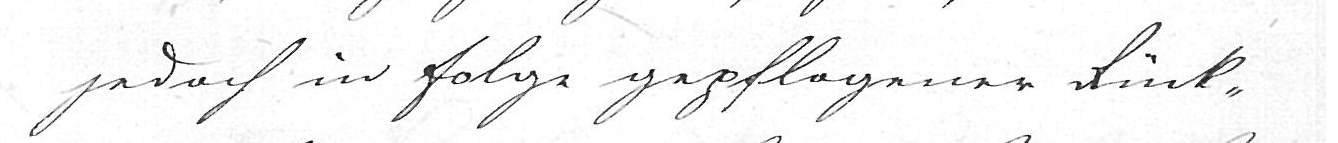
jedoch in Folge gepflogener Rück-
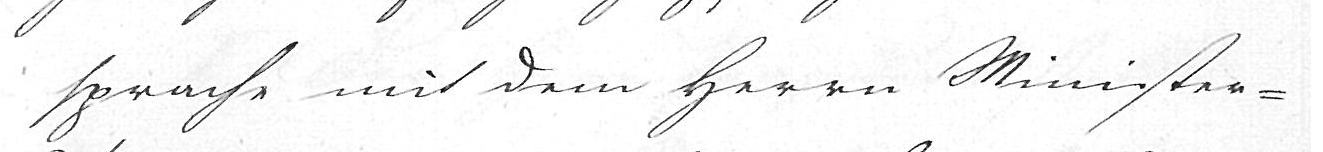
sprache mit dem Herrn Minister-
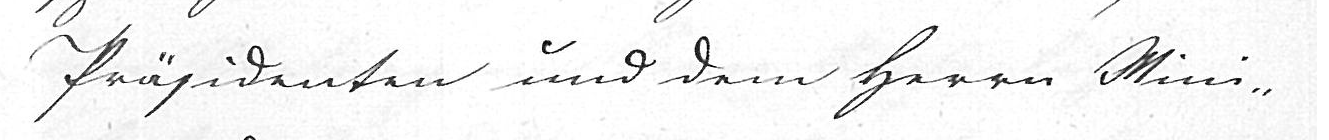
Präsidenten und dem Herrn Mini-
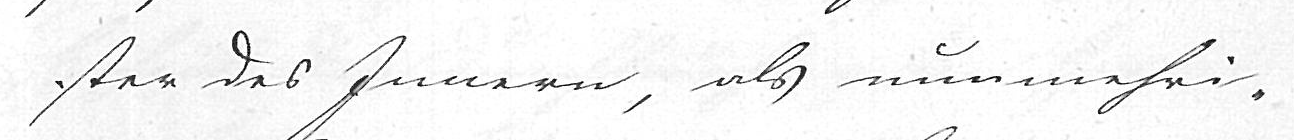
ster des Innern, als nunmehri-
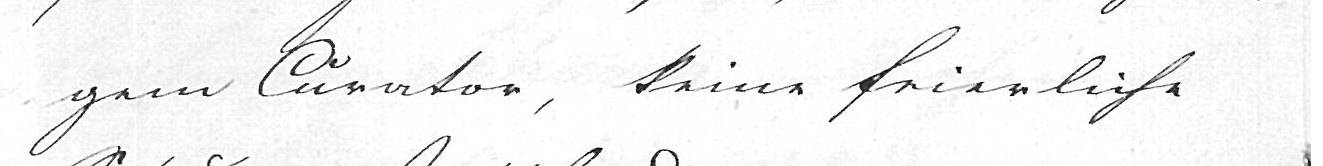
gen Curator, keine feierliche
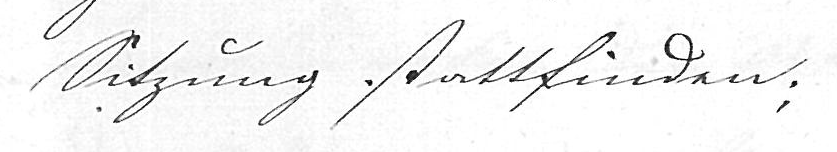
Sitzung stattfinden.
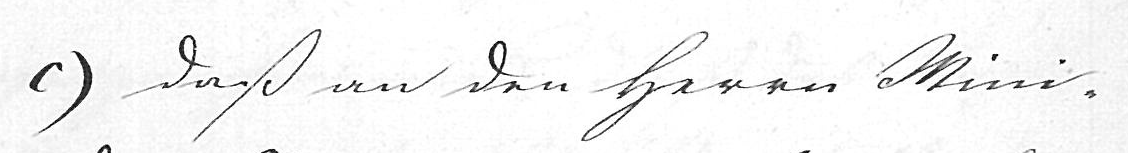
c) daß an den Herrn Mini-
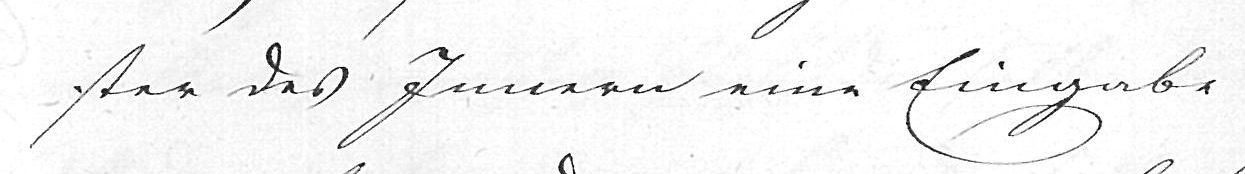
ster des Innern eine Eingabe
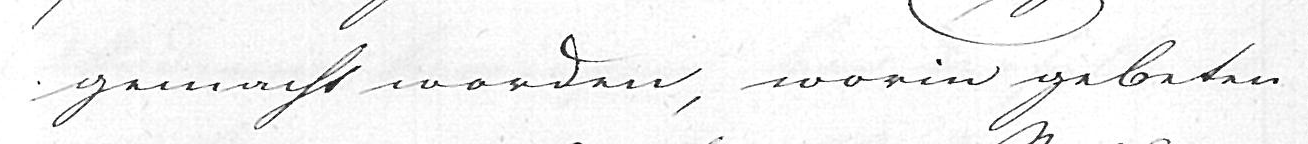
gemacht worden, worin gebeten
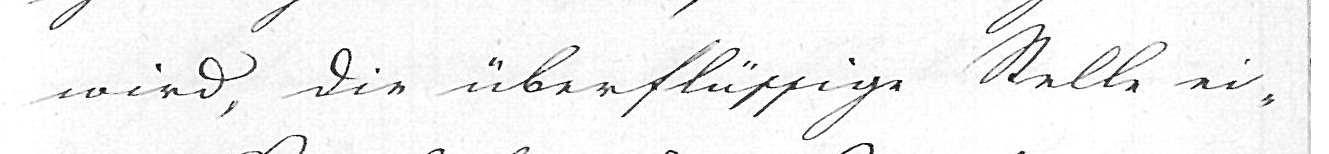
wird, die überflüssige Stelle ei-
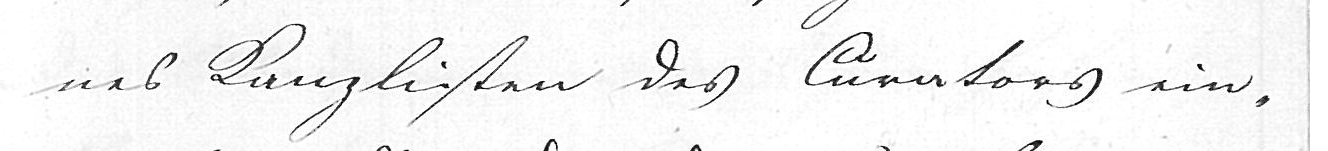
nes Kanzlisten des Curators ein-
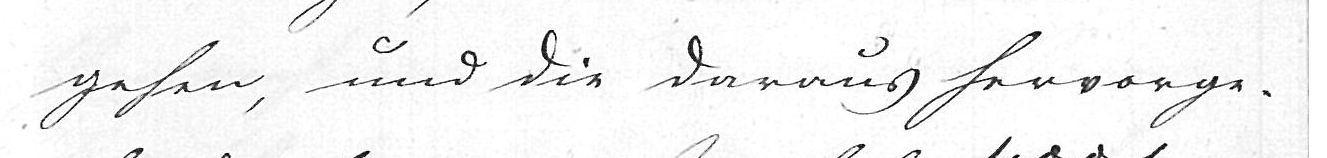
gehen und die daraus hervorge-
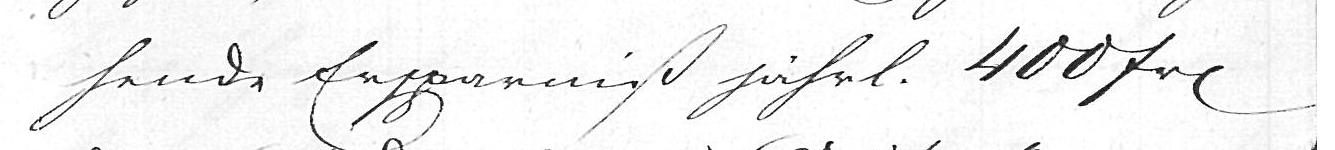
henden Ersparniß jährl. 400 fr
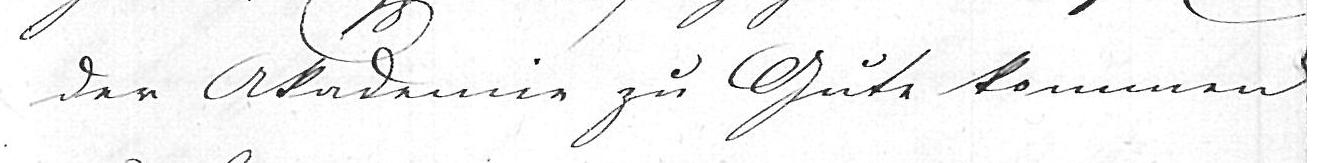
der Akademie zu Gute kommen
